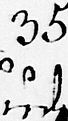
2.
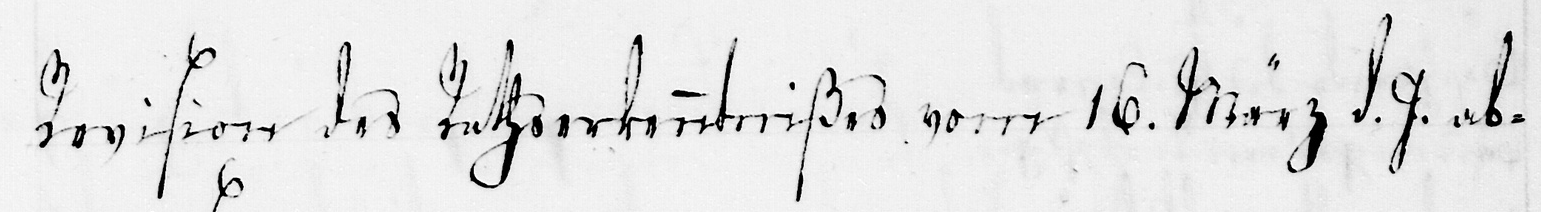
Revision des Rathserkenntnißes vom 16. März d. J. ab¬
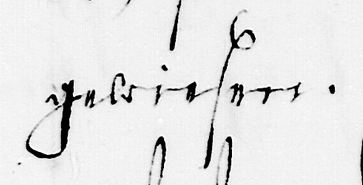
gewiesen.
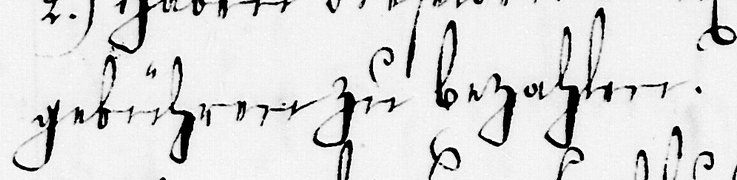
gebühren zu bezahlen.
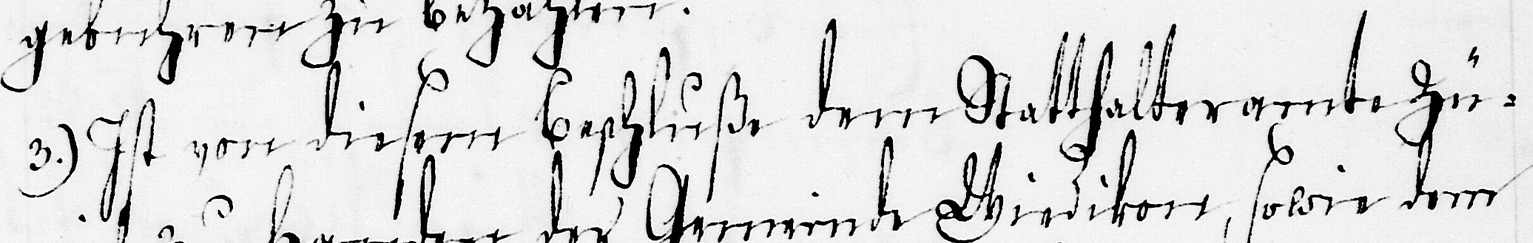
3.) Ist von diesem Beschluße dem Statthalteramte Zü¬
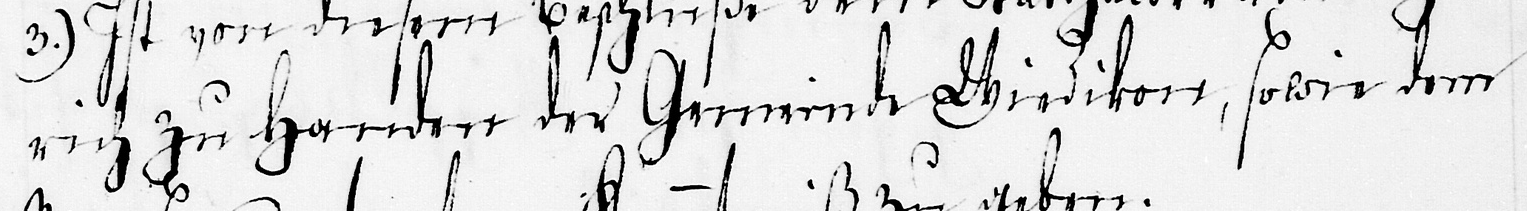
rich zu Handen der Gemeinde Wiedikon, sowie dem
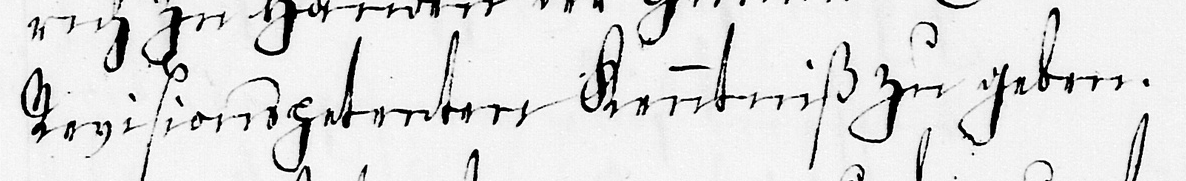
Revisionspetenten Kenntniß zu geben.
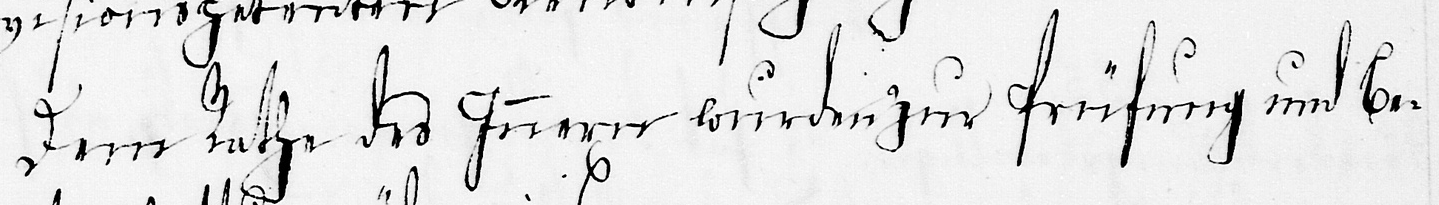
Dem Rathe des Innern wurden zur Prüfung und Be¬
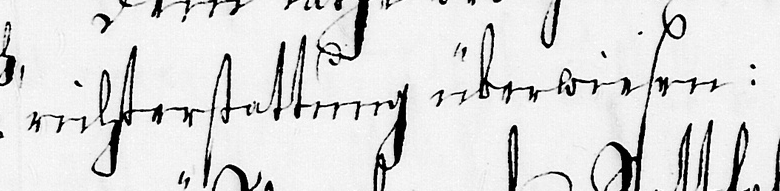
richterstattung überwiesen:
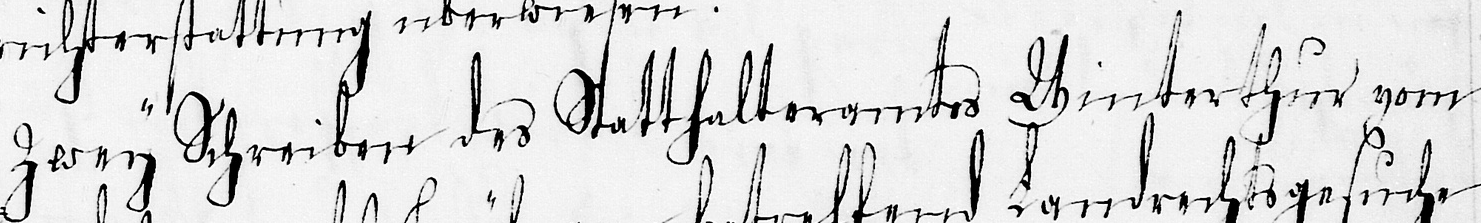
Zwey Schreiben des Statthalteramtes Winterthur vom
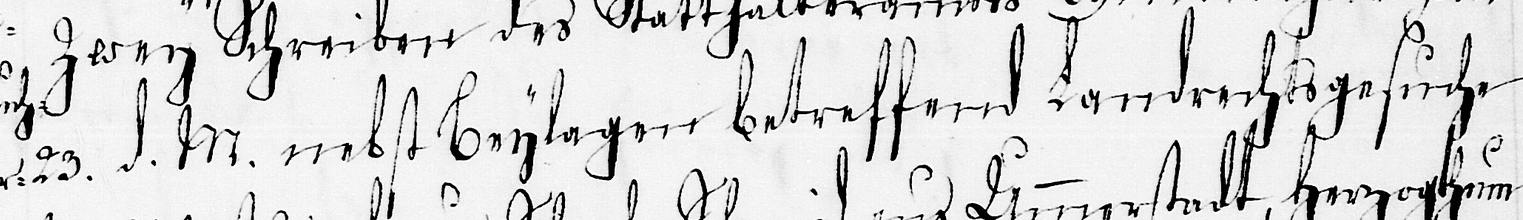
23. d. M. nebst Beylagen betreffend Landrechtsgesuche
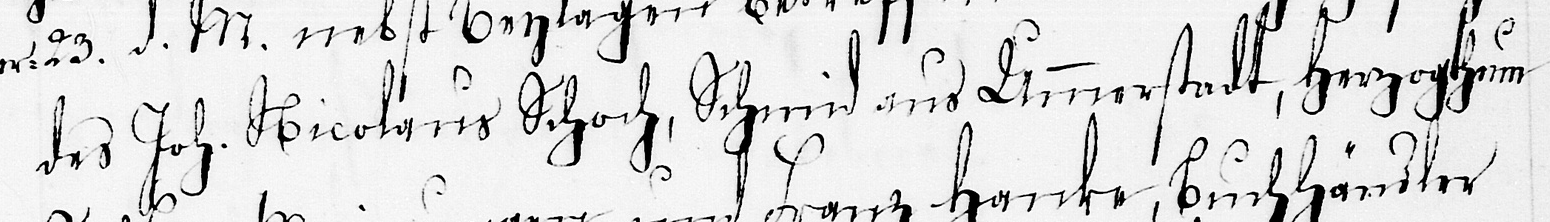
des Joh. Nicolaus Schoch, Schmid aus Ummerstadt, Herzogthum
